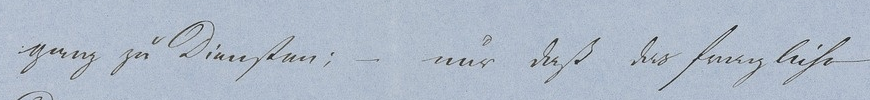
ganz zu Diensten; – daß das fragliche
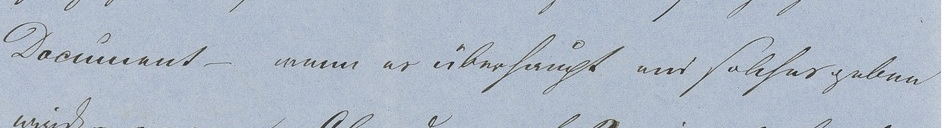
Document – wenn es überhaupt ein solches geben
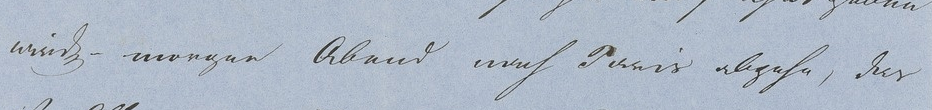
wird – morgen Abend nach Paris abgehe, das
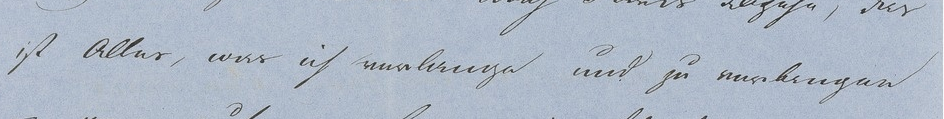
ist Alles, was ich verlange und zu verlangen
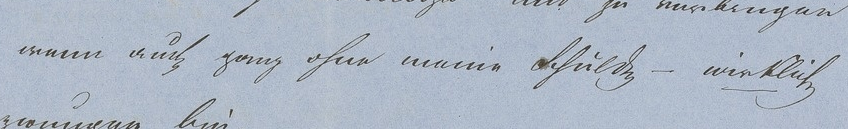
wenn auch ganz ohne meine Schuld – wirklich
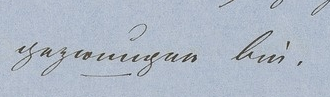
gezwungen bin.
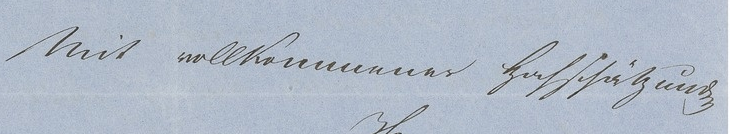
Mit vollkommener Hochschätzung
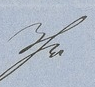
Ihr
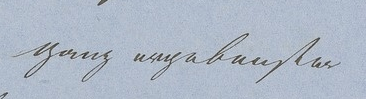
ganz ergebenster
